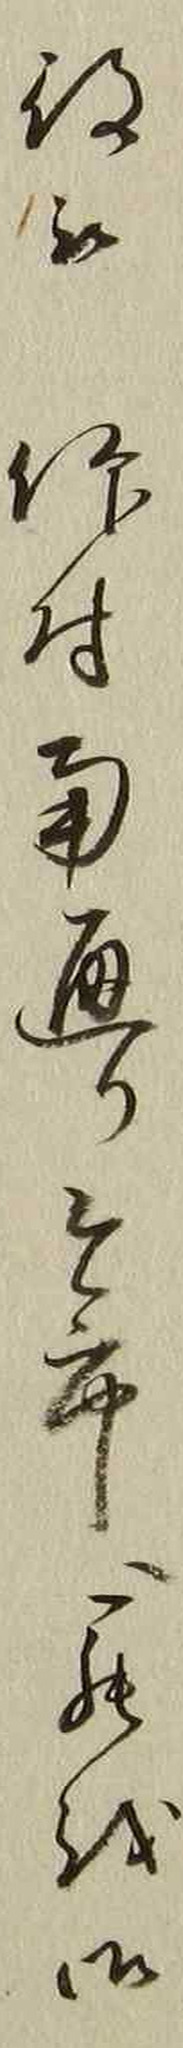役被仰付南通り今市へ罷越御
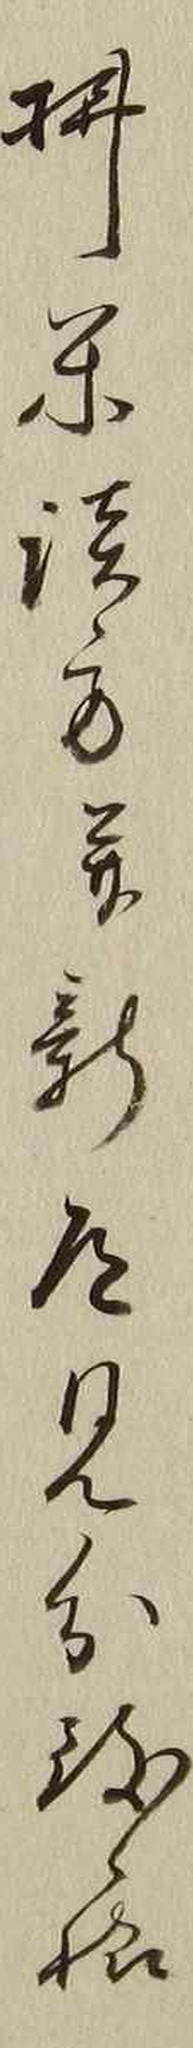払米談方幷新道見分致候様
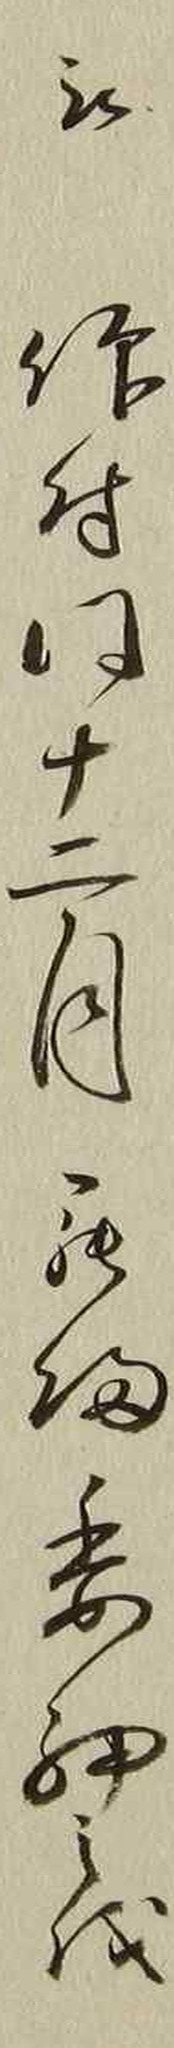被仰付同十二月罷帰委細之儀
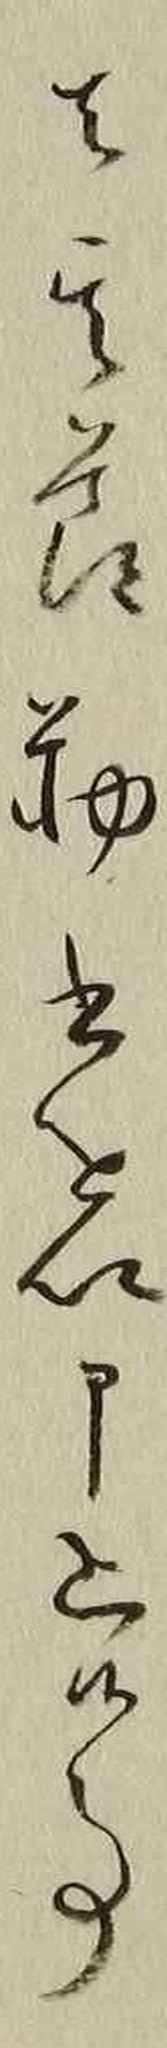は其節勤書を以申上候事
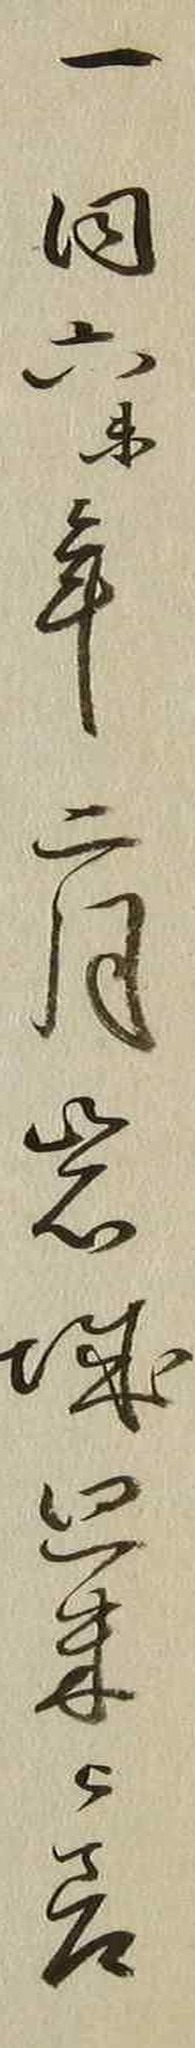一同六未年二月岩城廻米被差
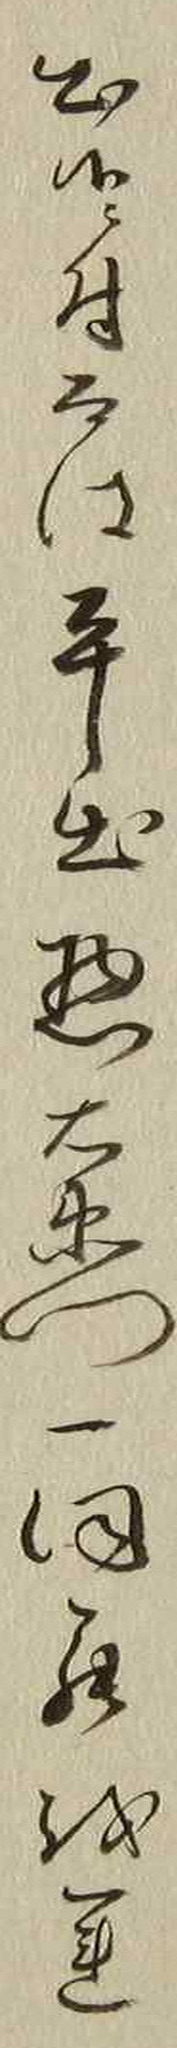出候ニ付而は平出惣右衛門一同罷越運
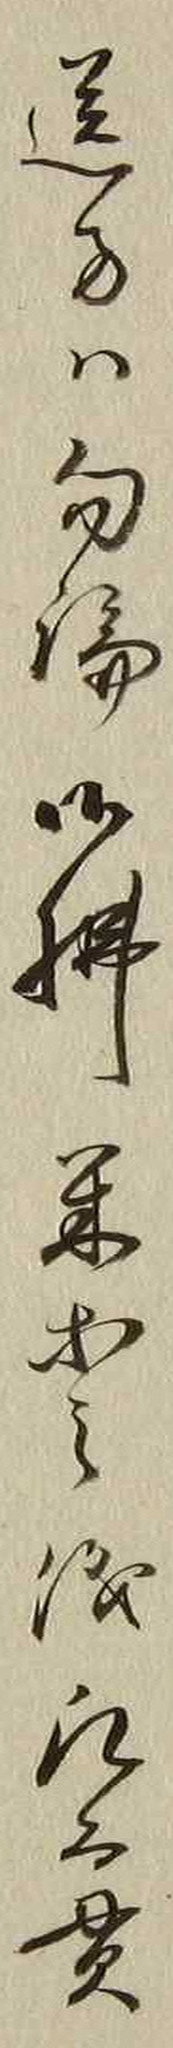送方ハ勿論御払米等之儀凡而貫
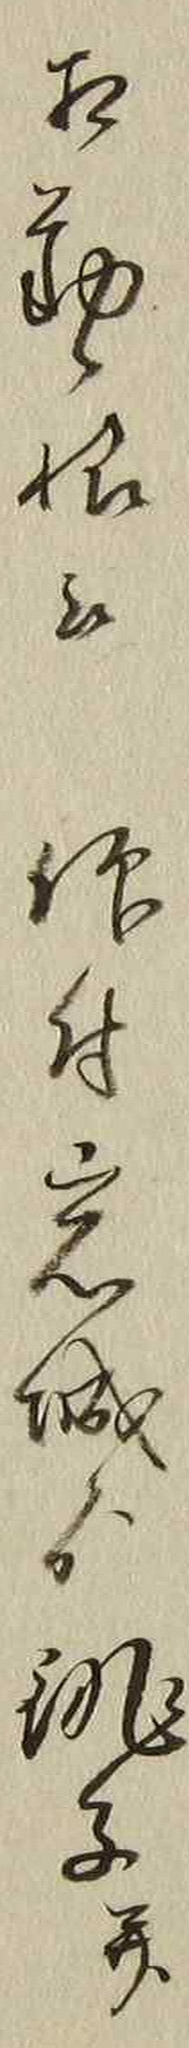相勤候様被仰付岩城ゟ銚子幷
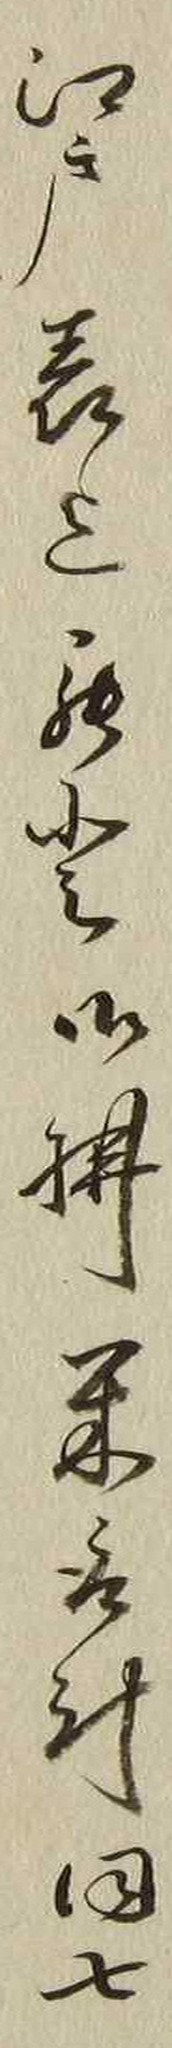江戸表迄罷登御払米取計同七
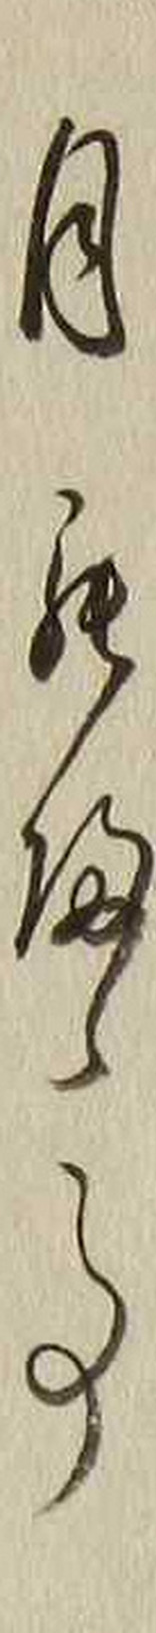月罷帰候事
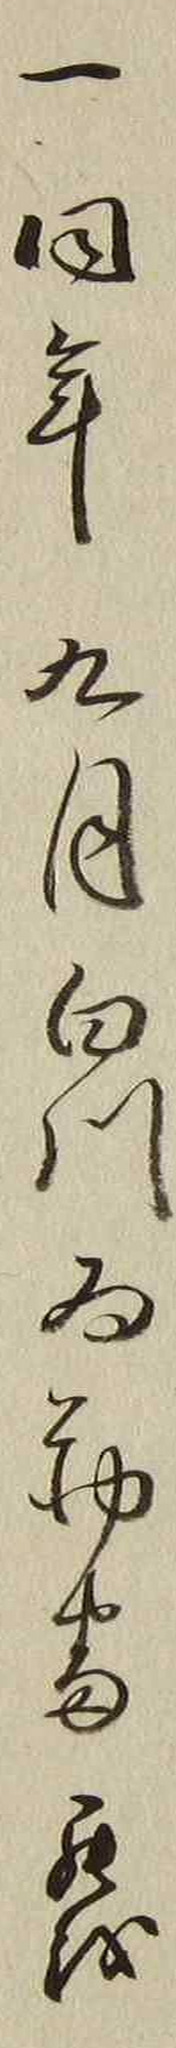一同年九月白川為勤番罷越
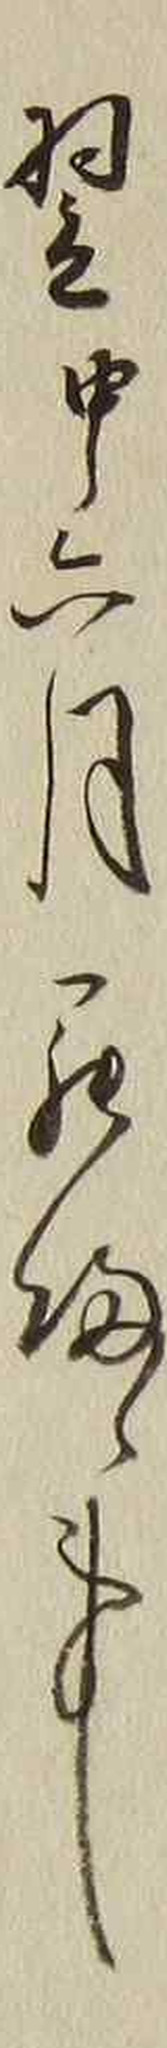翌申六月罷帰候事
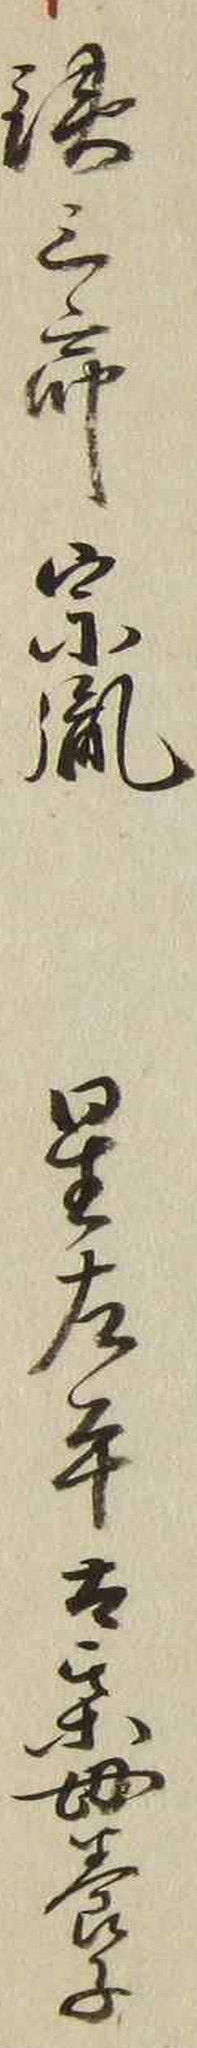鉄三郎宗胤星左平太某母養子

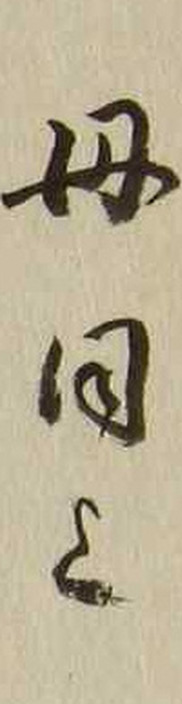母同上
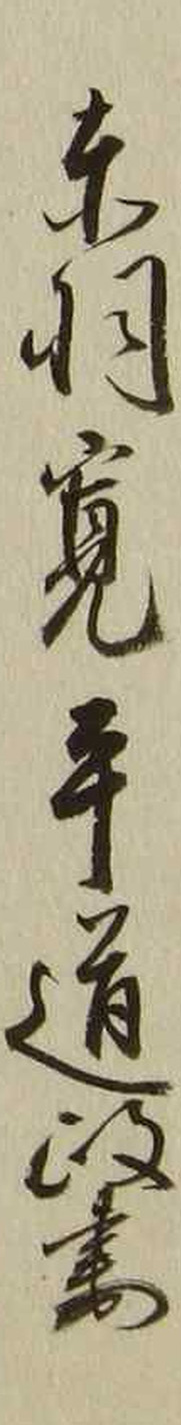女東羽寛平道政妻
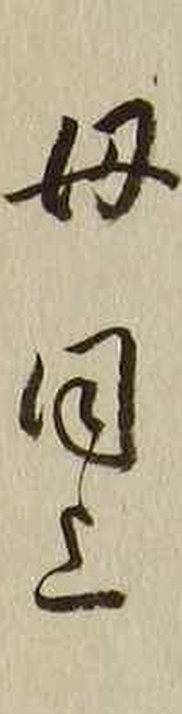母同上
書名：諸士系譜　巻之52　に之部3
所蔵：会津若松市立会津図書館
